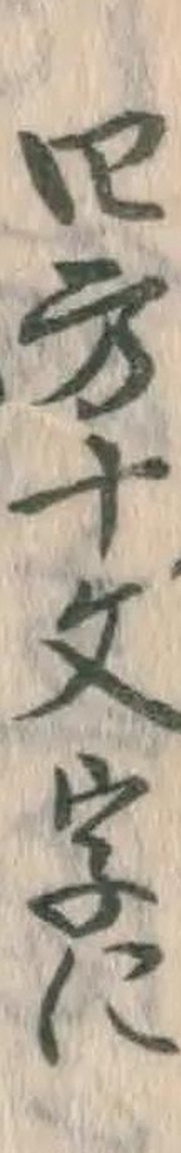四方十文字に
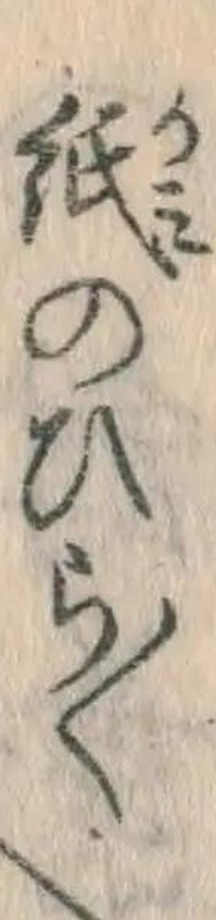紙のひら〳〵
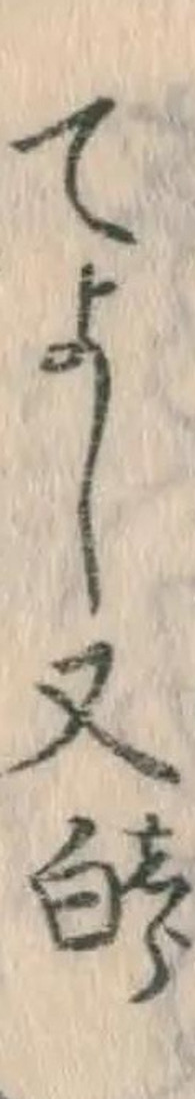てよし又白
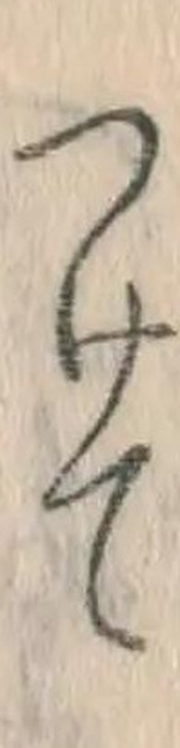つけて
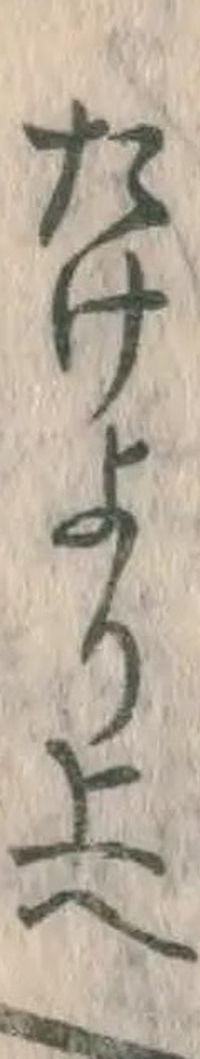たけより上へ
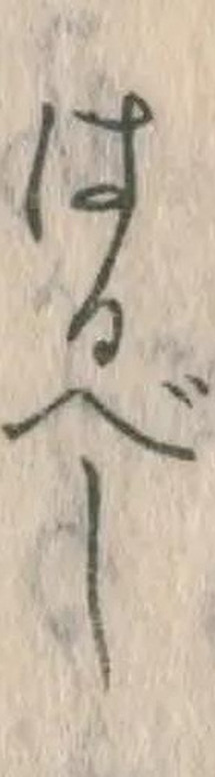はるべし
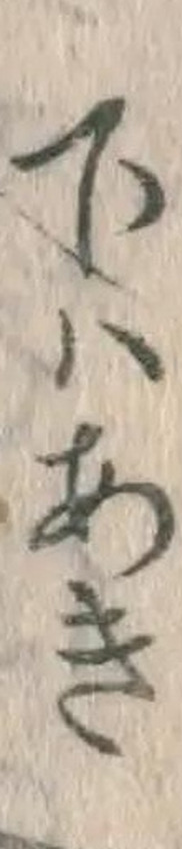下はあき
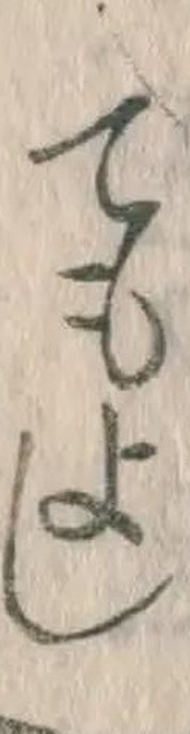てもよし

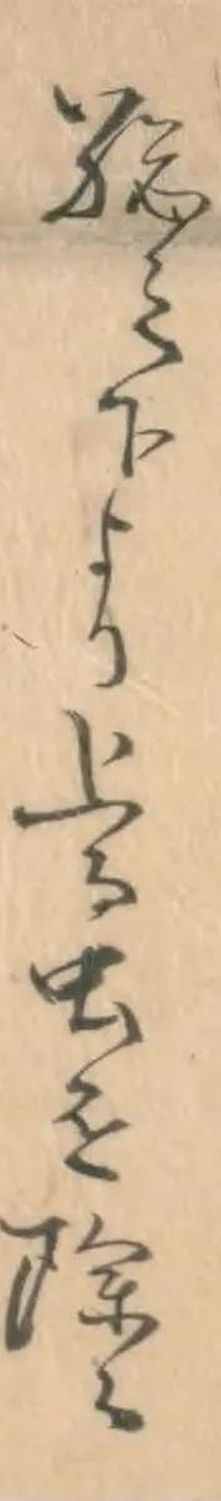編み下より上る虫を除く
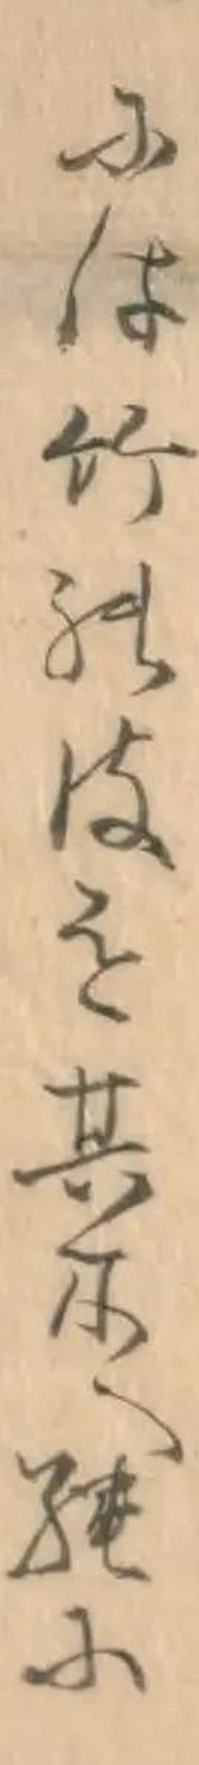には竹の皮を其木へ縄に
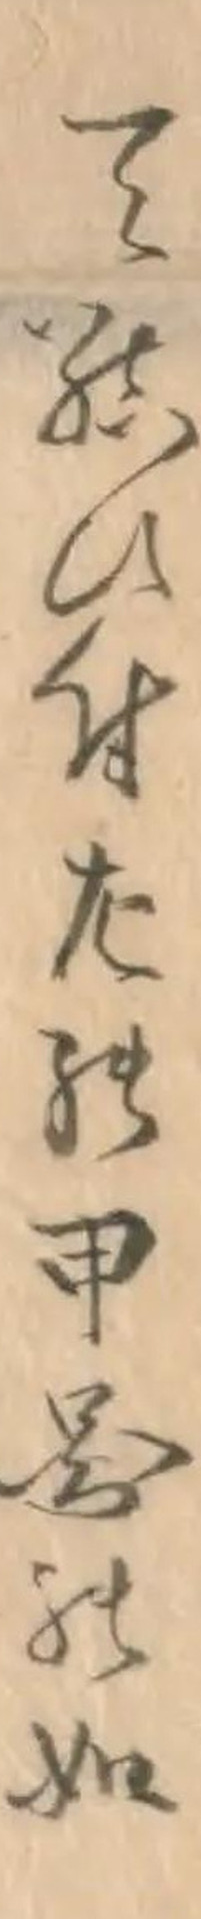て結ひ付左の甲図の如
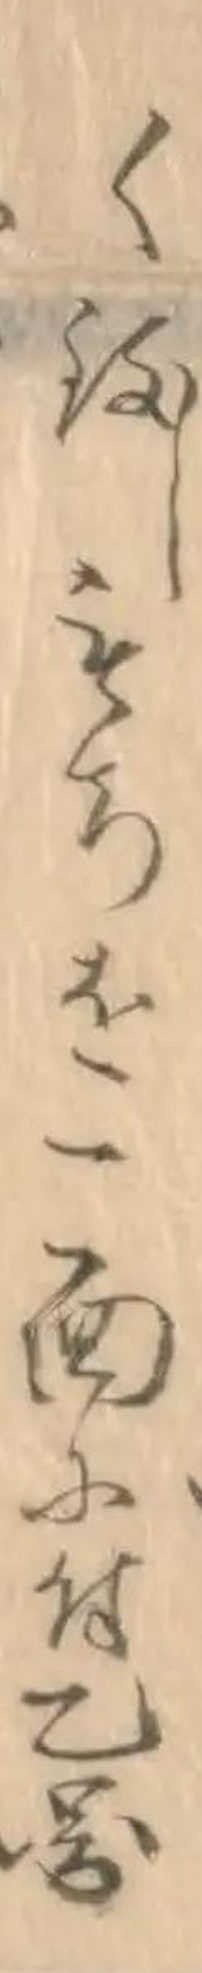く致しもちを一面に付乙図
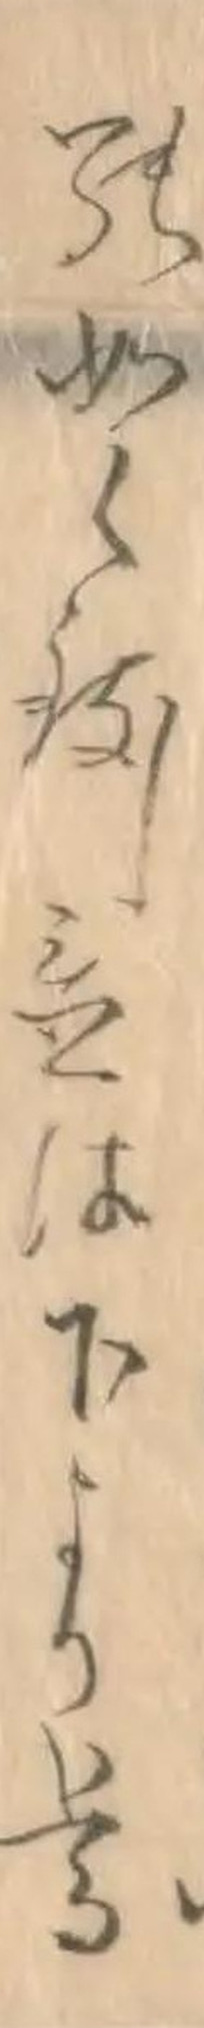の如く致し置は下より上る
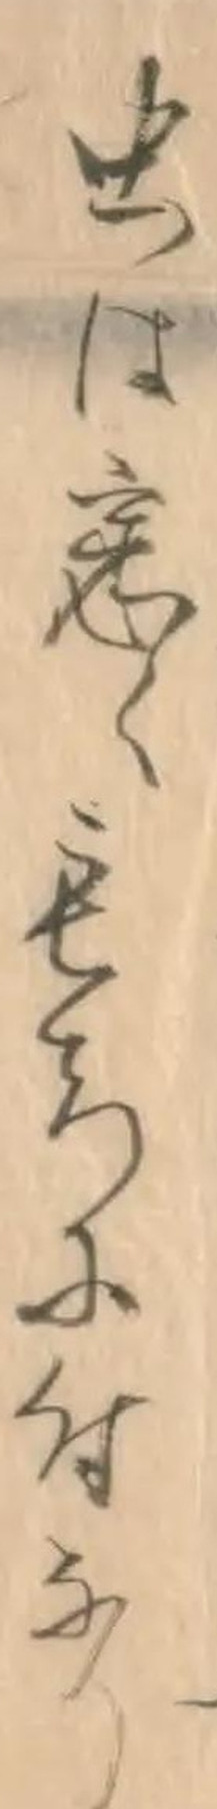虫は悉くもちに付なり
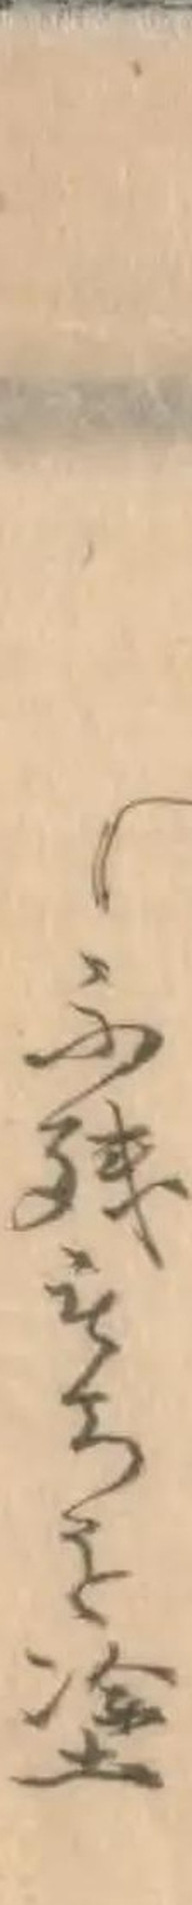不残もちを塗る
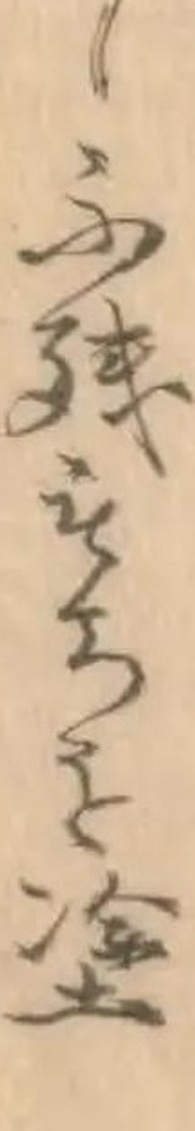不残もちを塗る
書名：山繭養法秘傳抄
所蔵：国立国会図書館 National Diet Library, JAPAN
